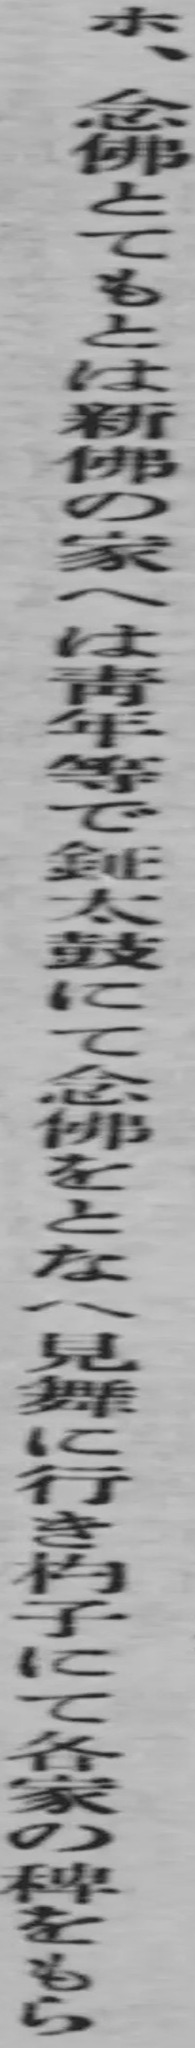ホ、念佛とてもとは新佛の家へは靑年等で鉦太鼓にて念佛をとなへ見舞に行き杓子にて各家の稗をもら
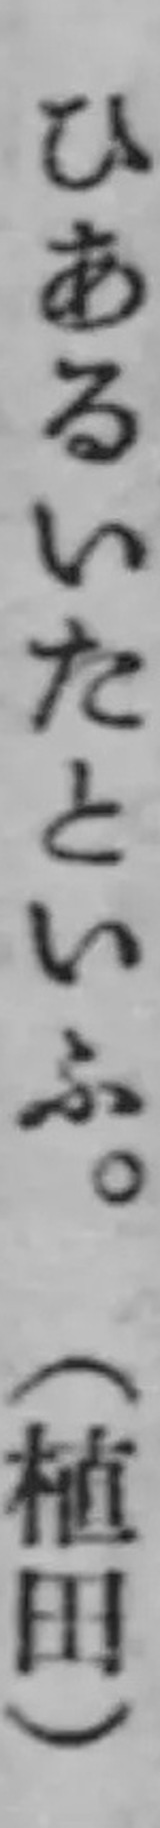ひあるいたといふ。(植田)
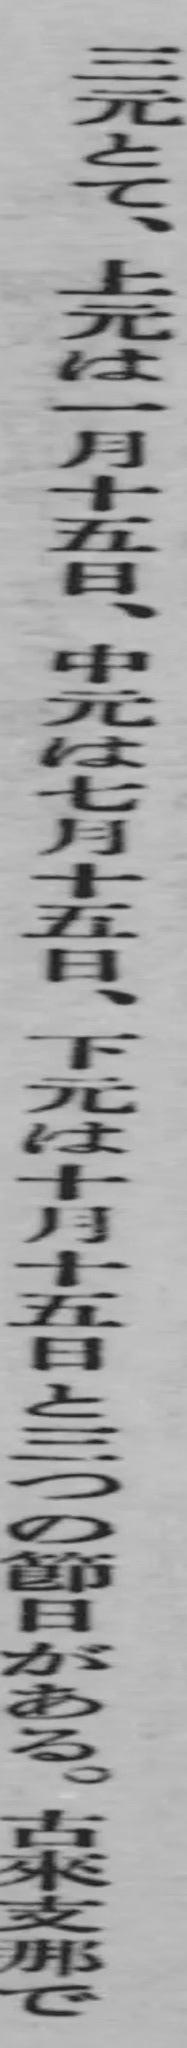三元とて、上元は一月十五日、中元は七月十五日、下元は十月十五日と三つの節日がある。古來支那で
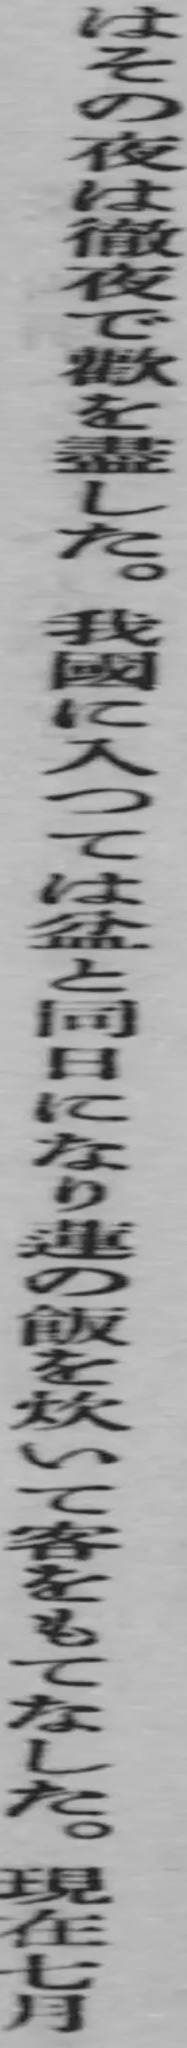はその夜は徹夜で歡を盡した。我國に入つては盆と同日になり蓮の飯を炊いて客をもてなした。現在七月
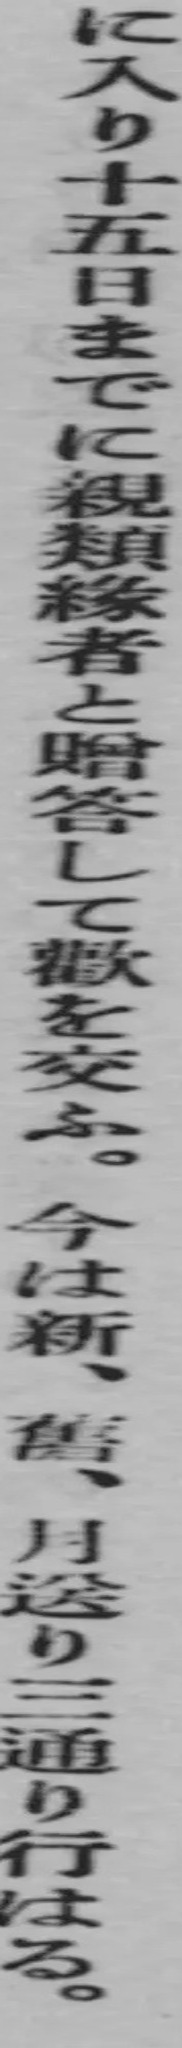に入り十五日までに親類緣者と贈答して歡を交ふ。今は新、舊、月送り三通り行はる。
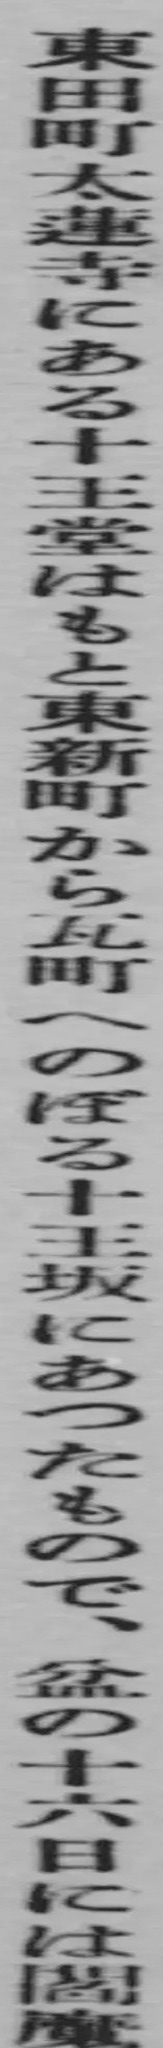東田町太蓮寺にある十王堂はもと東新町から瓦町へのぼる十王坂にあつたもので、盆の十六日には閻魔
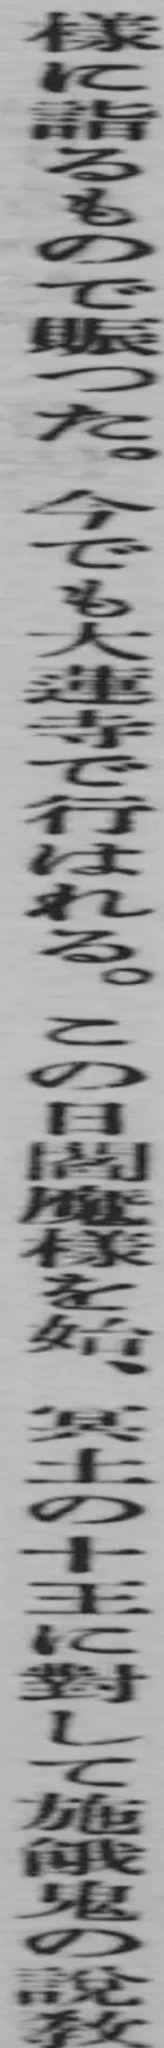様に詣るもので賑つた。今でも大蓮寺で行はれる。この日閻魔様を始、冥土の十王に對して施餓鬼の說敎
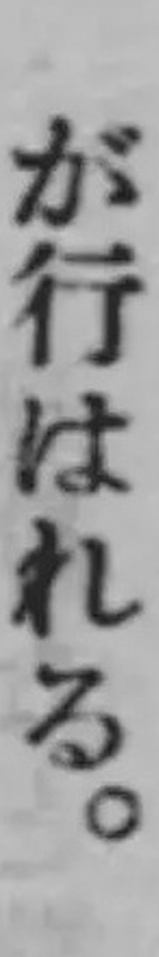が行はれる。
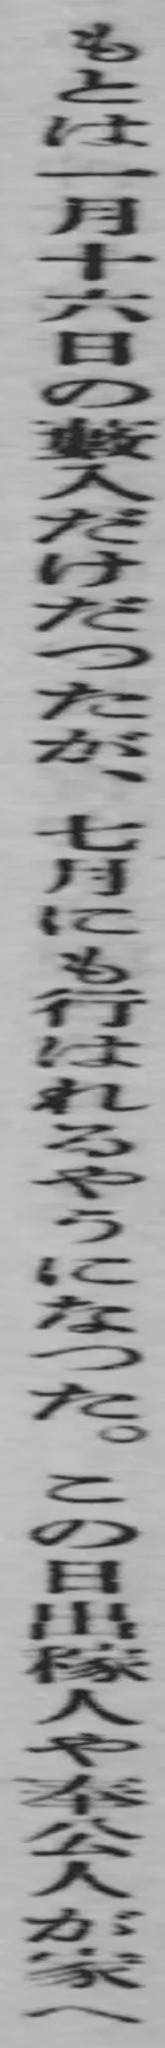もとは一月十六日の藪入だけだつたが、七月にも行はれるやうになつた。この日出稼人や奉公人が家へ
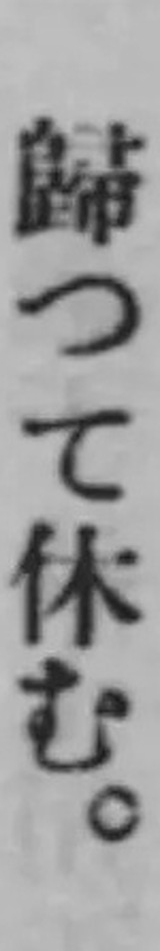歸つて休む。
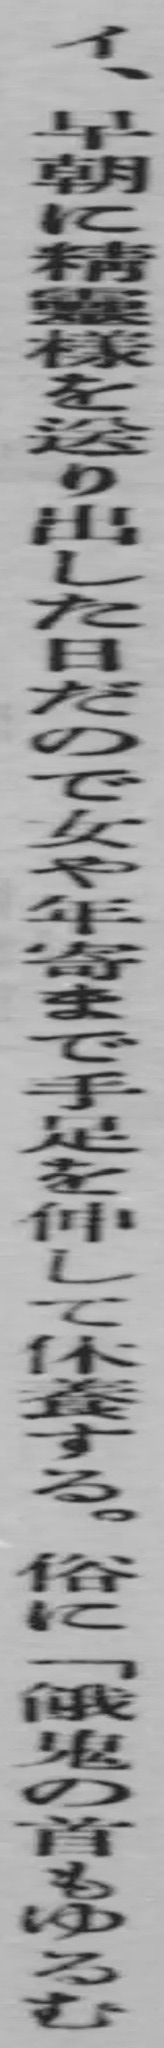イ、早朝に精靈様を送り出した日だので女や年寄まで手足を伸して休養する。俗に「餓鬼の首もゆるむ
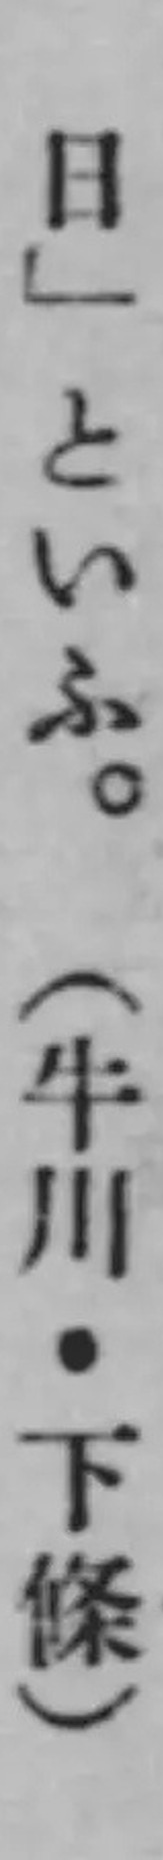日」といふ。(牛川・下條)
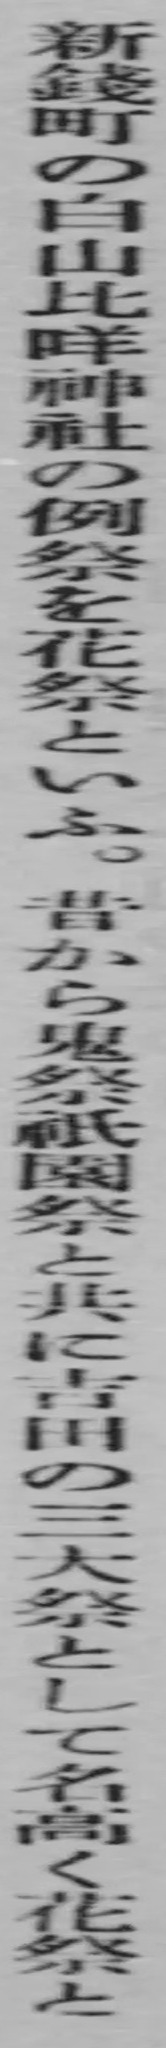新錢町の白山比咩神社の例祭を花祭といふ。昔から鬼祭祇園祭と共に吉田の三大祭として名高く花祭と
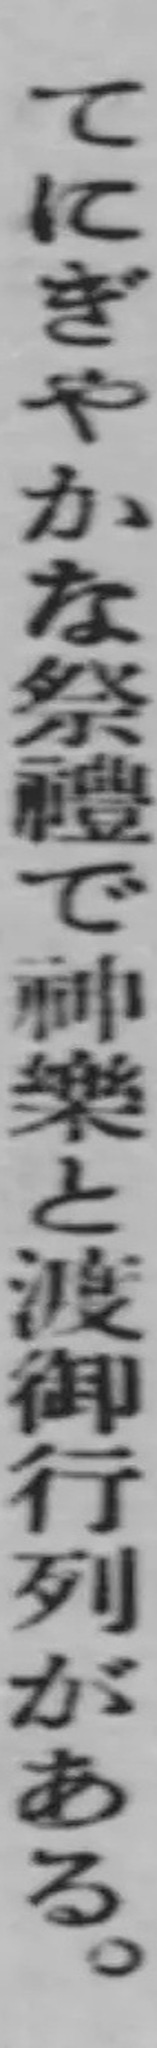てにぎやかな祭禮で神樂と渡御行列がある。
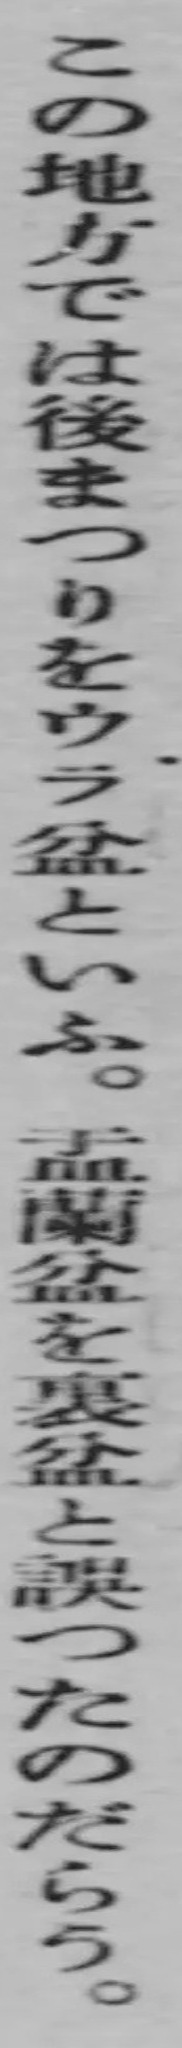この地方では後まつりをウラ盆といふ。盂蘭盆を裏盆と誤つたのだらう。
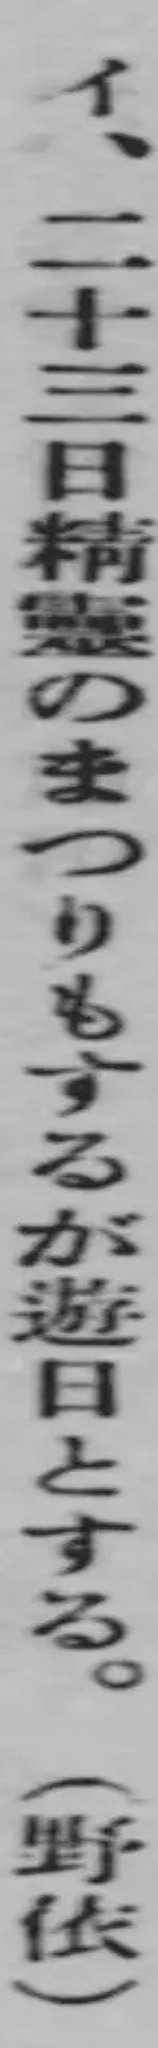イ、二十三日精靈のまつりもするが遊日とする。(野依)
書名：豊橋の年中行事
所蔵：国立国会図書館 National Diet Library, JAPAN
